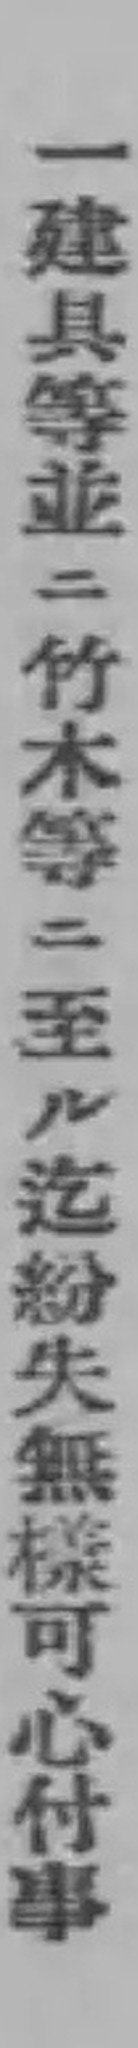一建具等並ニ竹木等ニ至ル迄紛失無様可心付事
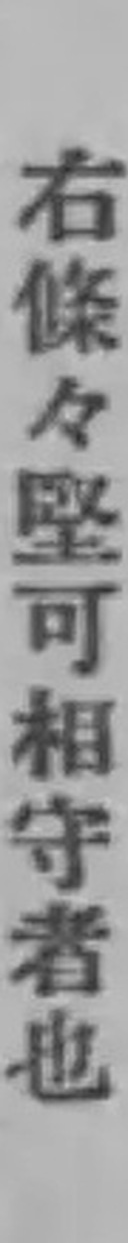右條々堅可相守者也
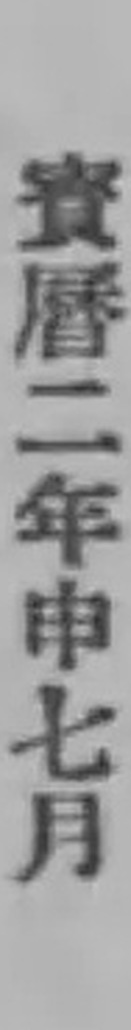宝暦二年申七月
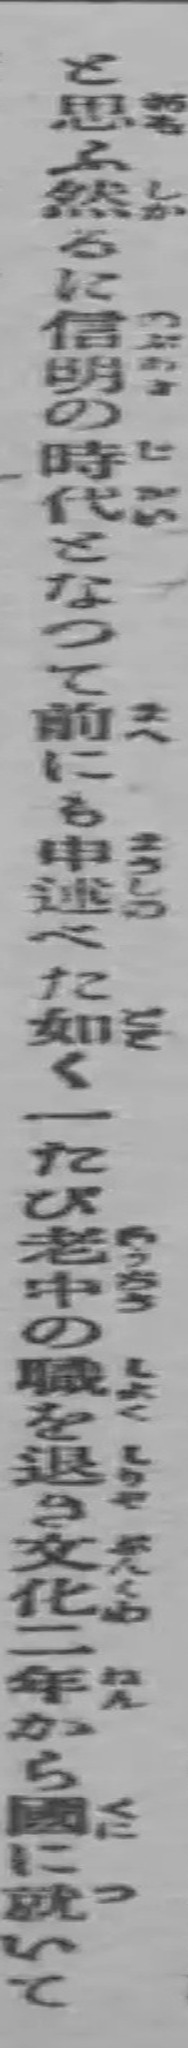と思ふ然るに信明の時代となつて前にも申述べた如く一たび老中の職を退き文化二年から国に就いて
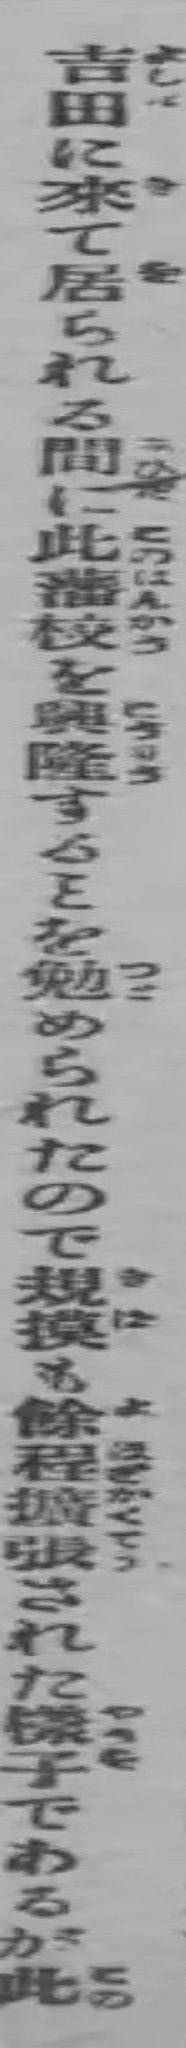吉田に来て居られる間に此藩校を興隆することを勉められたので規模も余程拡張された様子であるが此
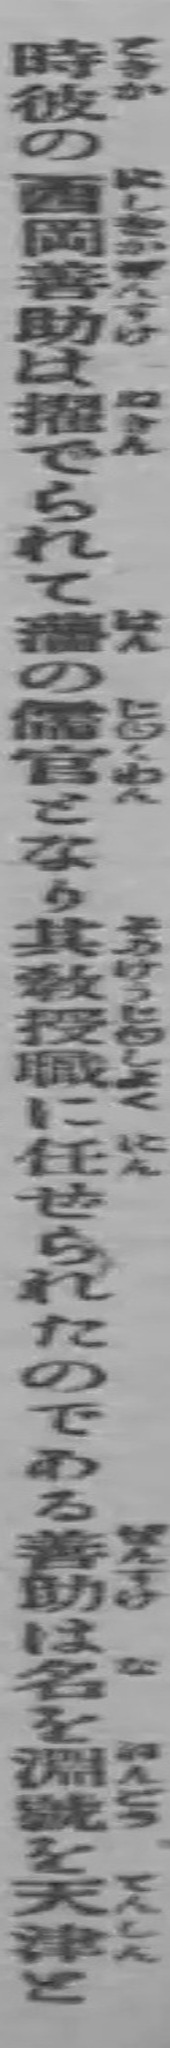西岡善助時彼の西岡善助は擢でられて藩の儒官となり其教授職に任ぜられたのである善助は名を淵号を天津と
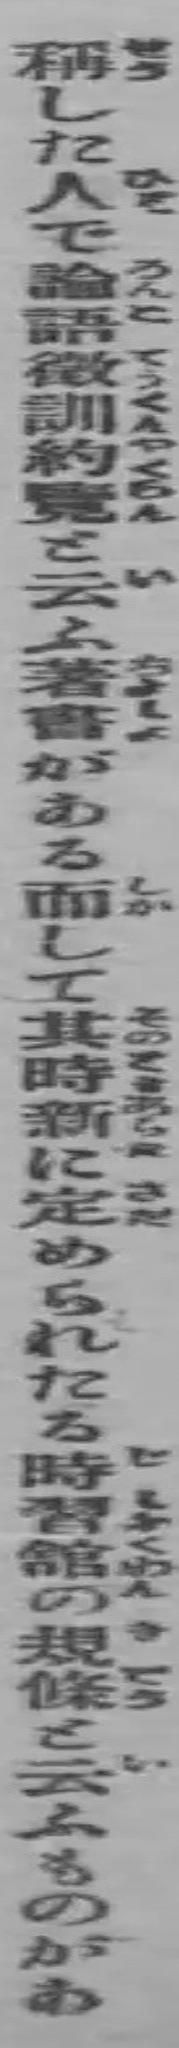称した人で論語徴訓約覧と云ふ著書がある而して其時新に定められたる時習館の規條と云ふものがあ
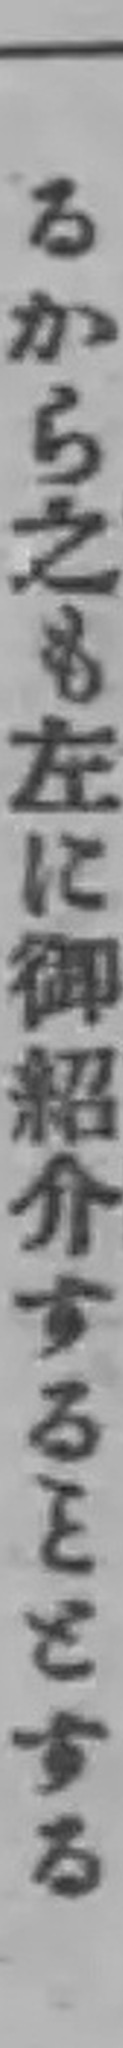るから之も左に御紹介することとする
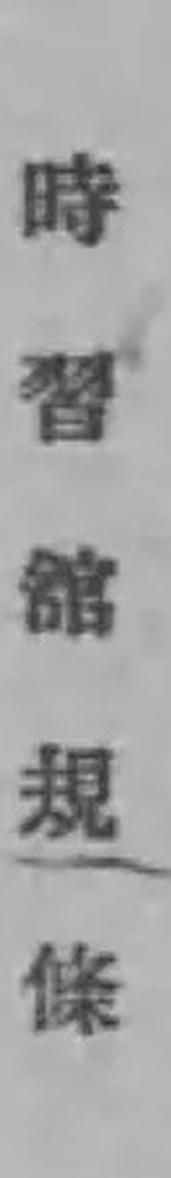時習館規條
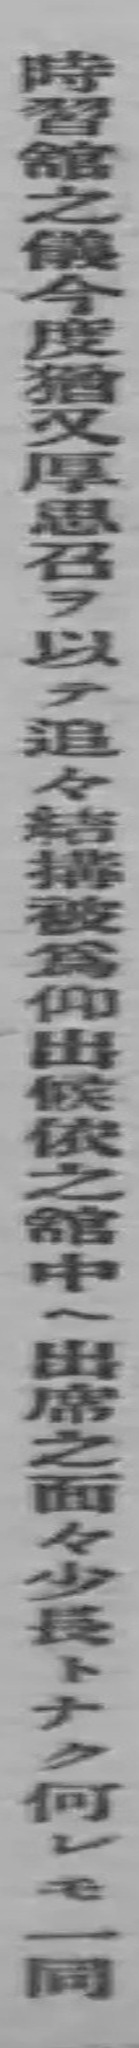時習館之儀今度猶又厚思召ヲ以テ追々結構被為仰出候依之館中へ出席之面々少長トナク何レモ一同
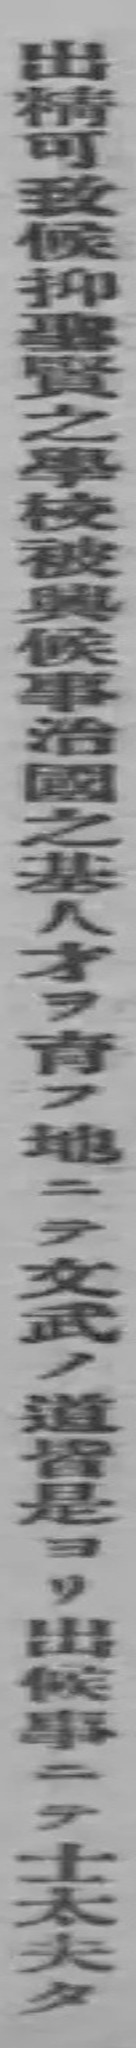出精可致候抑聖賢之学校被興候事治国之基人才ヲ育フ地ニテ文武ノ道皆是ヨリ出候事ニテ士太夫タ
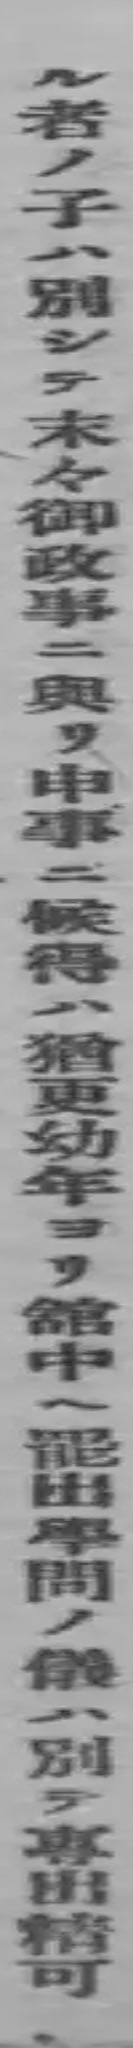ル者ノ子ハ別シテ末々御政事ニ与リ申事ニ候得ハ猶更幼年ヨリ館中ヘ罷出学問ノ儀ハ別テ専出精可
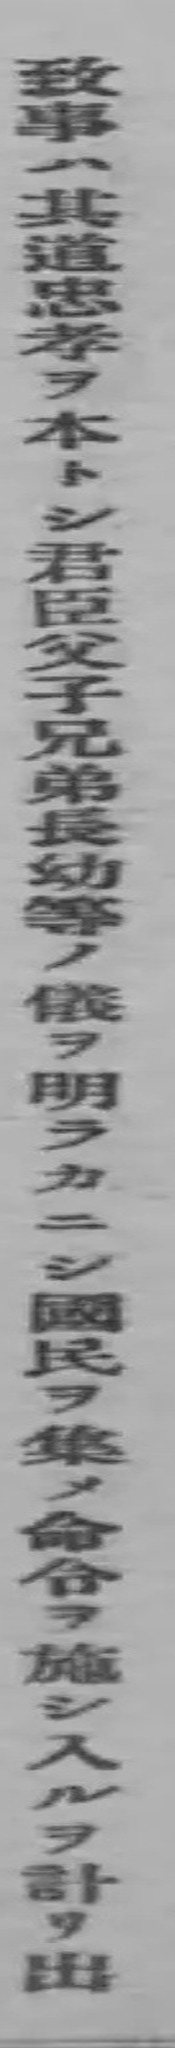致事ハ其道忠孝ヲ本トシ君臣父子兄弟長幼等ノ儀ヲ明ラカニシ国民ヲ集メ命令ヲ施シ入ルヲ計リ出
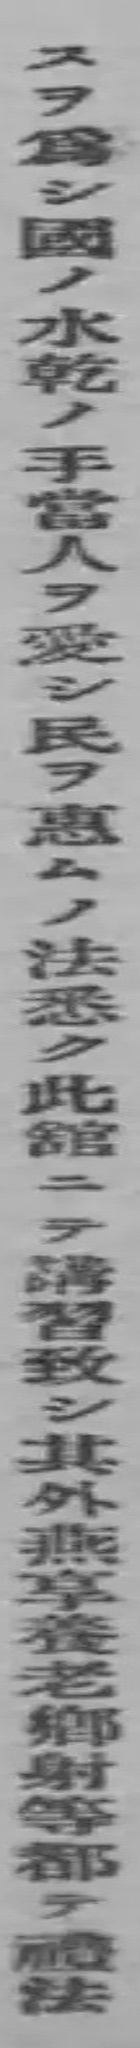スヲ為シ国ノ水乾ノ手当人ヲ愛シ民ヲ恵ムノ法悉ク此館ニテ講習致シ其外燕享養老郷射等都テ礼法
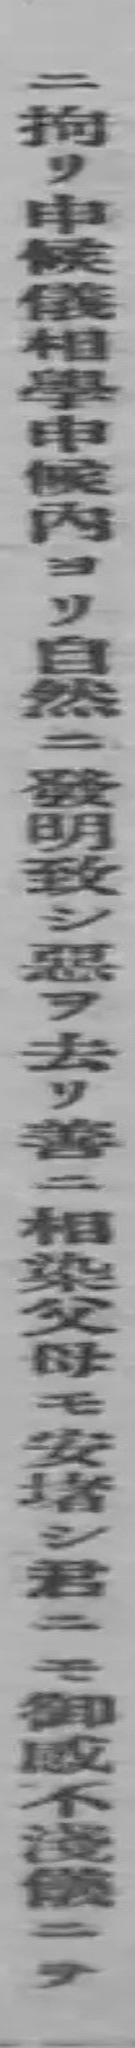ニ拘リ申候儀相学申候内ヨリ自然ニ発明致シ悪ヲ去リ善ニ相染父母モ安堵シ君ニモ御成不浅儀ニテ
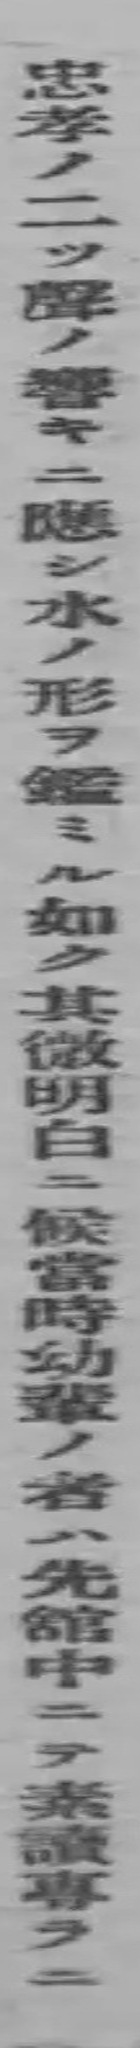忠孝ノ二ツ声ノ響キニ応シ水ノ形ヲ鑑ミル如ク其微明白ニ候当時幼輩ノ者ハ先館中ニテ素読専ラニ
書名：豊橋市史談
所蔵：国立国会図書館 National Diet Library, JAPAN
